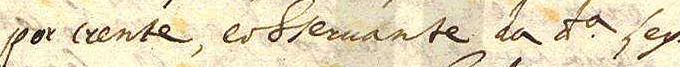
por crente, e obseruante da d̄a. Ley.
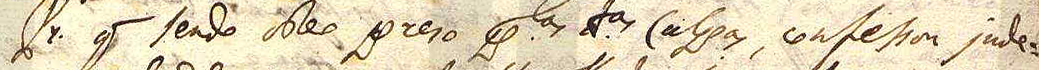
Pr. q̄ sendo o Reo preso p.las d̄.as Culpas, confessou jude
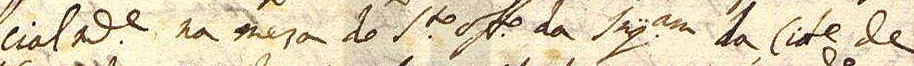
çialmte. na meza do S.to off.o da Inq.am da Çid̄e de
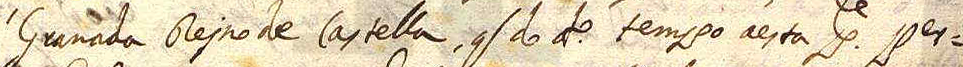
Granada Rejno de Castella, q̄ do d̄.o tempo a esta p.te per
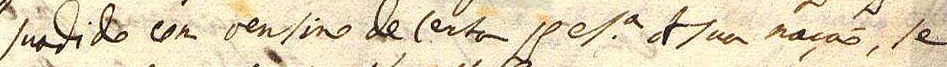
suadido com o ensino de Çerta pes.a d̄ sua naçaõ, se
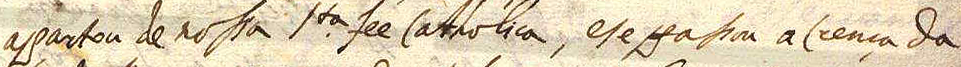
apartou de nossa Sta. fee Catholica, e se passou a Crença da
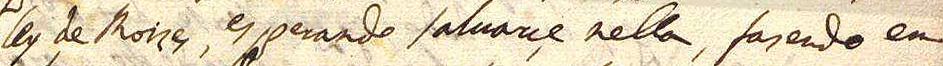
ley de Moizes, esperando saluarçe nella, fazendo em
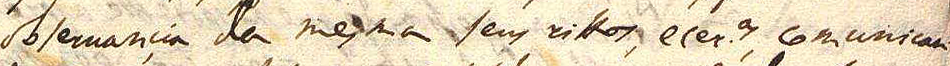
obseruançia da mesma seus rittos, e cer.as, comunican
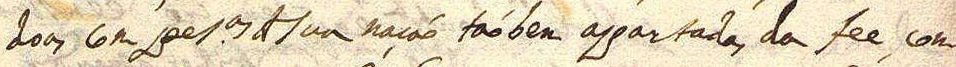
doas com pes.as d̄ sua naçaõ taõbem apartadas da fee, com
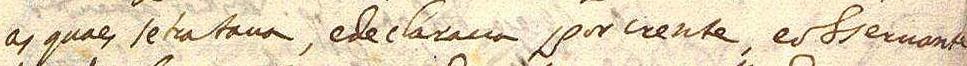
as quaes se trataua, e declaraua por crente, e obseruante
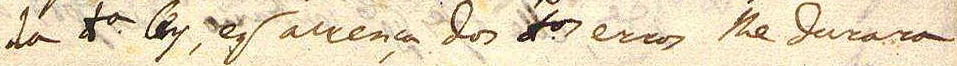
da d̄a. ley, e q̄ a crença dos d̄os. erros lhe durara
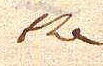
the
